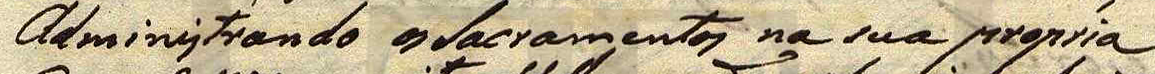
Administrando os Sacramentos na sua propria
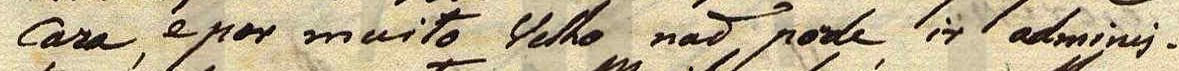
caza, e por muito Velho, naõ pode ir adminis
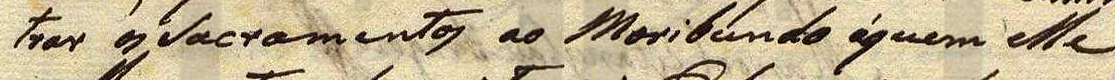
trar os sacramentos ao Moribundo á quem elle
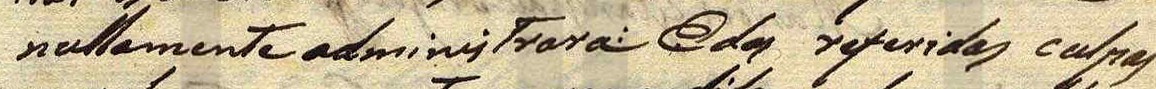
nullamente administrara: E das referidas culpas
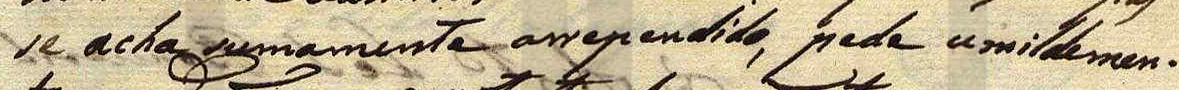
se acha sumamente arrependido, pede umildemen
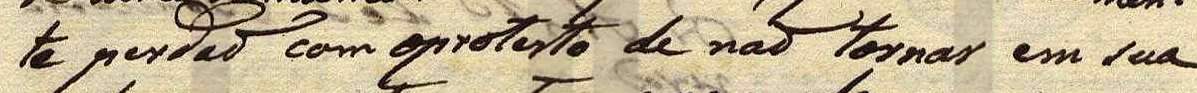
te perdaõ com o protesto de naõ tornar em sua
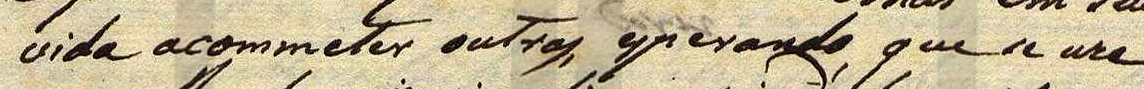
vida a commeter outras, esperando, que se uze
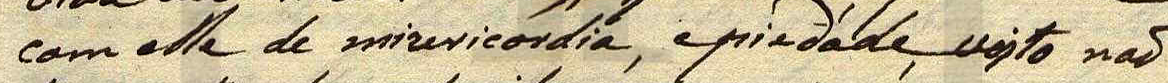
com elle de mizericordia, e piedade, visto naõ
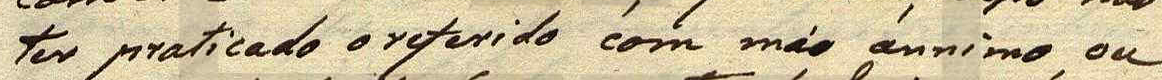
ter praticado o referido com máo annimo, ou
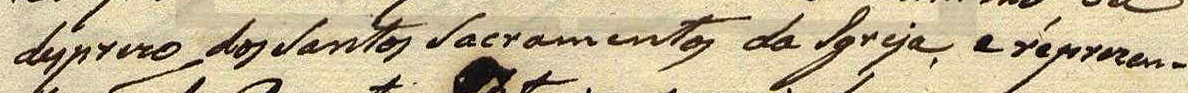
desprezo dos Santos Sacramentos da Igreja, e reprezen
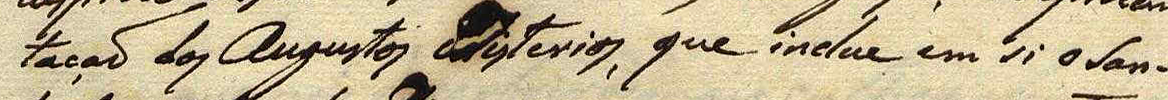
laçaõ dos Augustos Misterios, que inclue em si o San
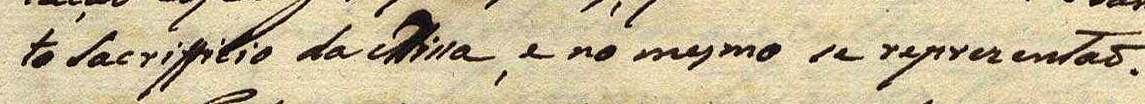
to sacrifficio da Missa, e no mesmo se reprezentaõ.
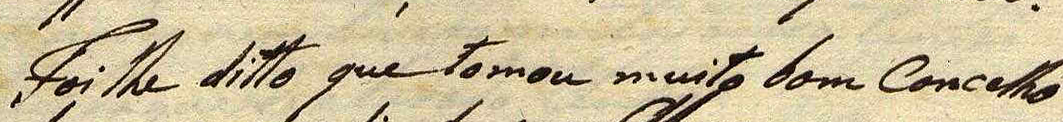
Foilhe ditto que tomou muito bom Concelho
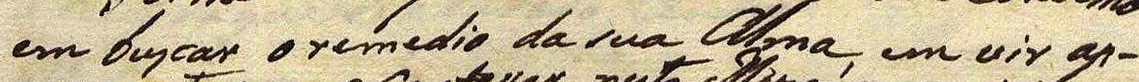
em buscar o remedio da sua Alma, em vir ap
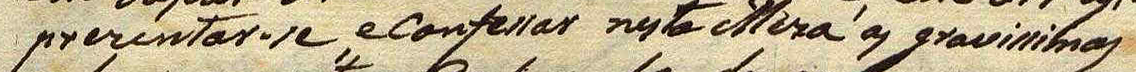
prezentar-se, e confessar nesta Meza as gravissimas
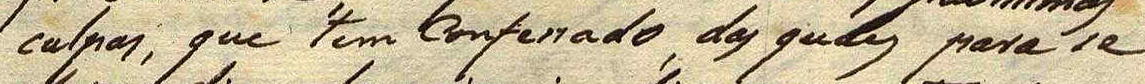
culpas, que tem Confessado, das quaes para se
